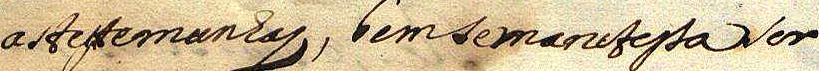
as testemunhas, bem se manifesta ser
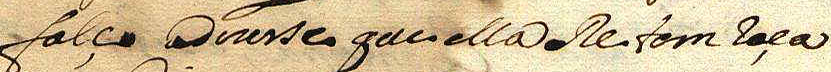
falço o dizerse que ella Re tem raça
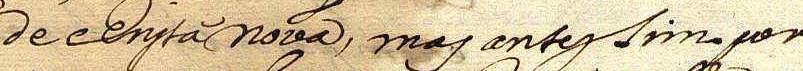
de christã nova, mas antes sim por
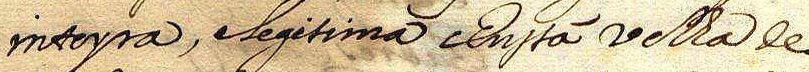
inteyra, e Legitima christã velha de
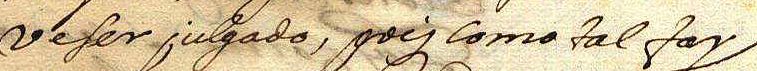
ve ser julgado, pois como tal foy
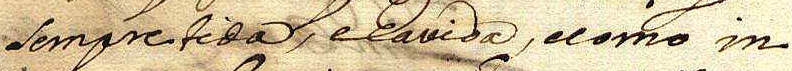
sempre tida, e havida, e como in
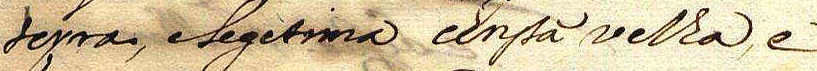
teyra, e Legitima christã velha, e
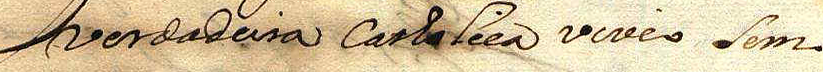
verdadeira catholica viveo sem
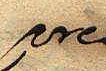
pre
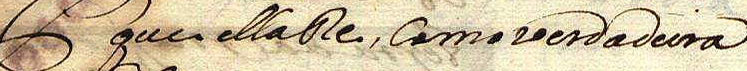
P que ella Re, como verdadeira
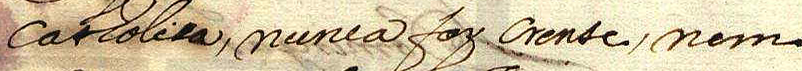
catholica, nunca foy crente, nem
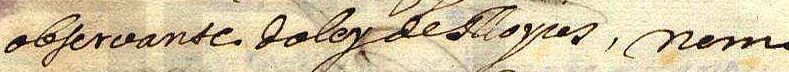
observante da Ley de Moyzes, nem
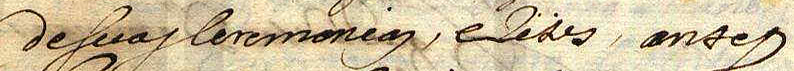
de suas ceremonias, e Ritos, antes
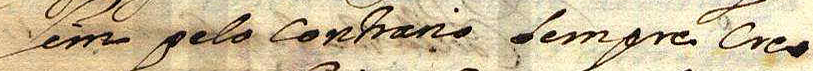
sim pelo contrario sempre creo
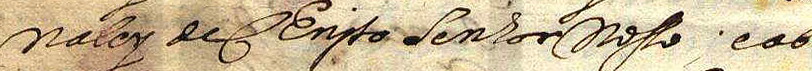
na ley de Christo Senhor nosso; e ob
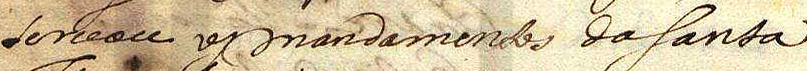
servou os mandamentos da santa
